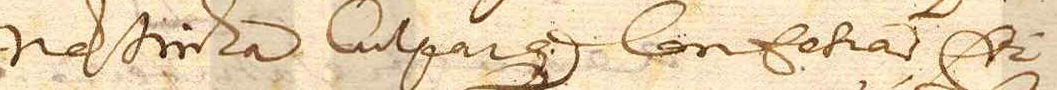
naõ tinha Culpas q̄ Confessar, foi
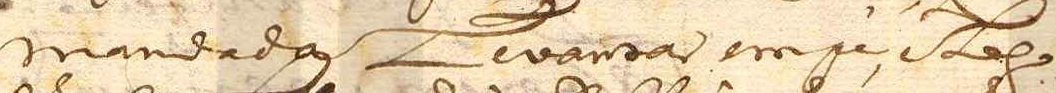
mandada Levantar em pé, e Logo
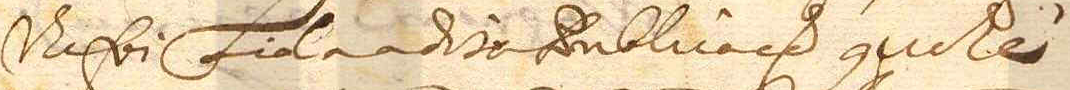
lhe foi Lida a dita Publicaçaõ que hé
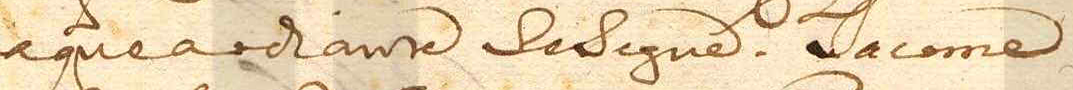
a que aodiante se segue. Iacome
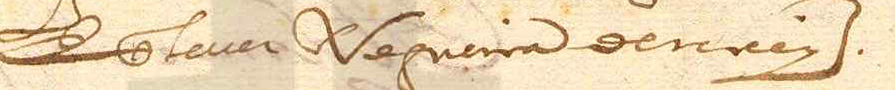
Esteues Nogueira o escreuj
